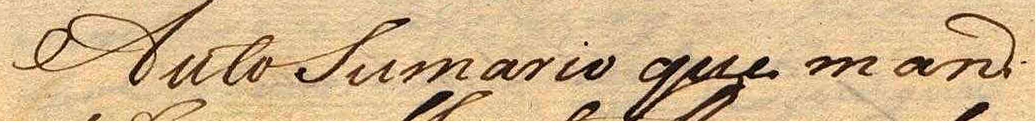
Auto Sumario que man
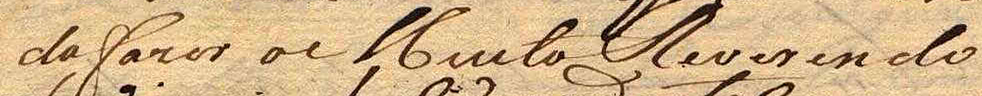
da fazer o Muito Reverendo
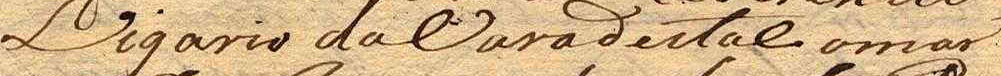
Vigario da Vara desta Comar
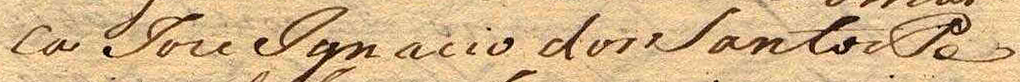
ca Ioze Ignacio dos Santos Pe
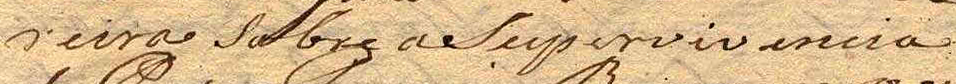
reira Sobre a Supervivencia
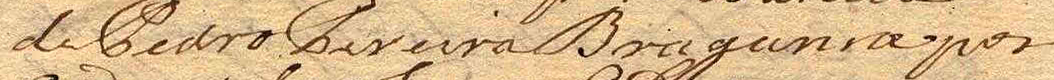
de Pedro Pereira Braganca por
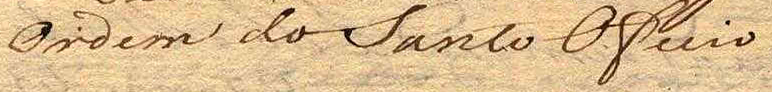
Ordem do Santo Oficio
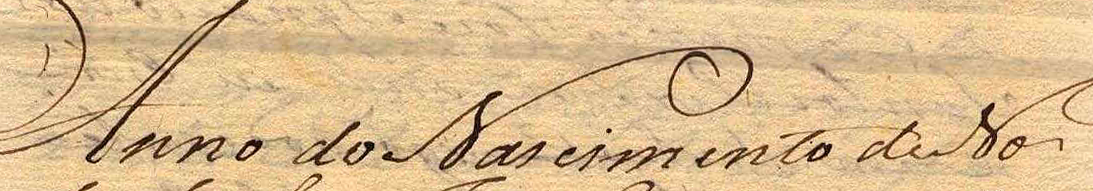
Anno do Nascimento de Nos
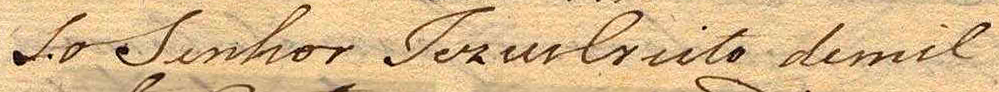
so Senhor Iezus Cristo de mil
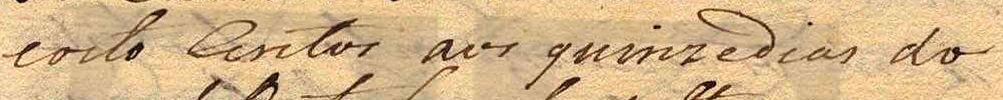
e oitoCentos aos quinze dias do
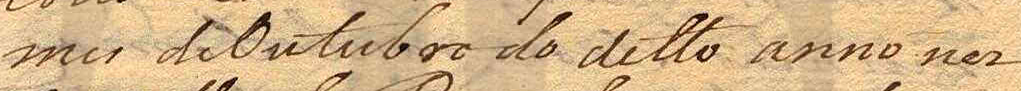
mes de Outubro do ditto anno nez
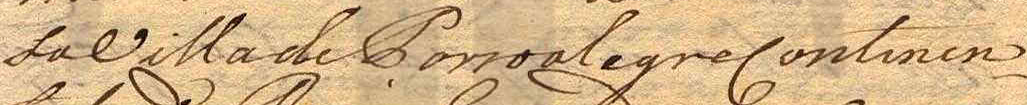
ta Villa de Porto alegre Continen
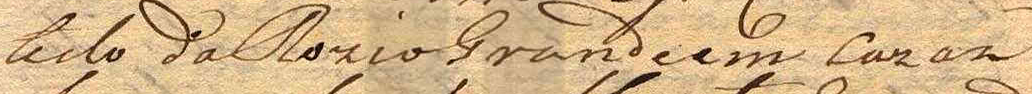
te do Rozio Grande em Cazaz
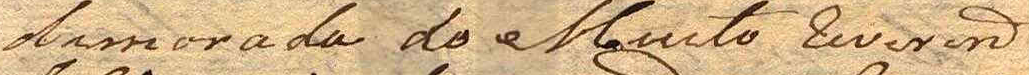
da morada do e Muito Reveren
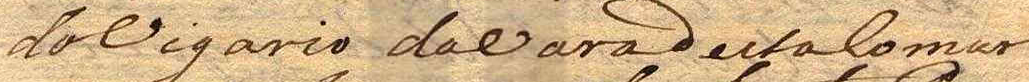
do Vigario da vara desta Comar
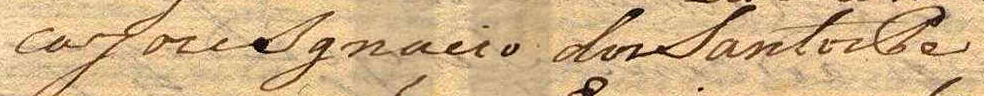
ca Joze Ignacio dos Santos Pe
